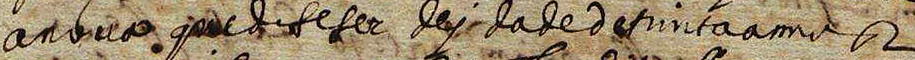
a noua que dise ser de jdade de trinta annos
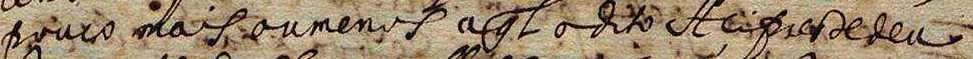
pouco mais ou menos a q̄L o dito Açipreste deu
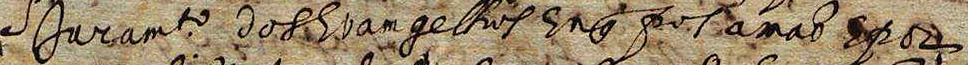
Juramto. dos Evamgelhos En q̄ pos a maõ E por
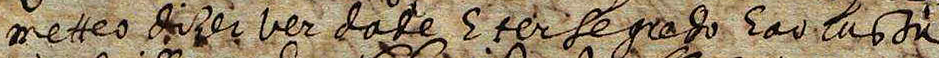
metteo dizer verdade E ter segredo E ao custu
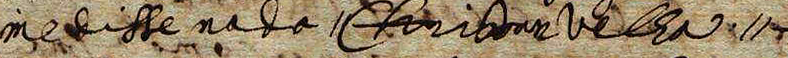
me disse nada / Christan Velha. // -
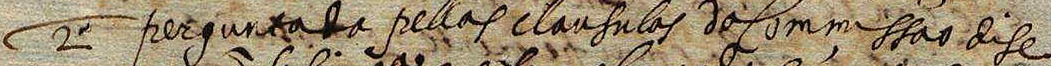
item perguntada pellas clausulas da Commissão dise
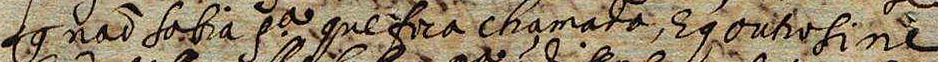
q̄ naõ sabia p.a que fora chamada, E q̄ outrosi ne
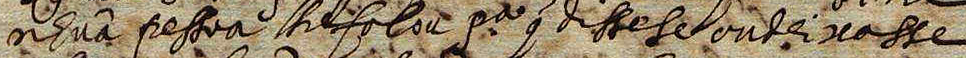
nhuā pessoa lhe falou p.a q̄ dissese ou deixasse
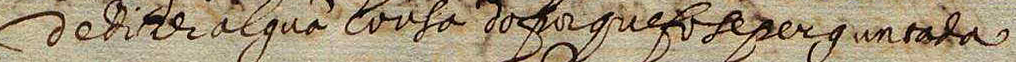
de dizer alguā cousa do porque fose perguntada
